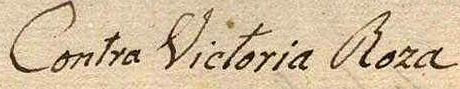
Contra Victoria Roza
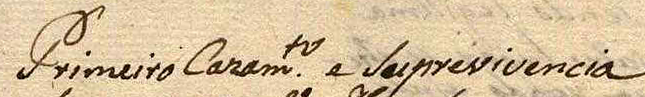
Primeiro Cazam.to e suprevivencia
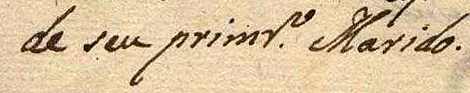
de seu primr.o Marido.
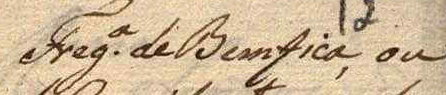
Freg.a de Bemfica, ou
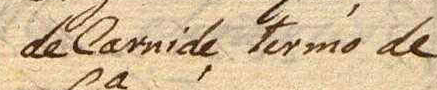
de Carnide, termo de
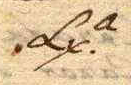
Lx.a
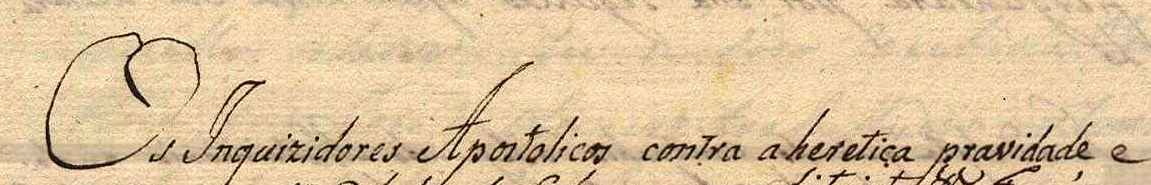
Os Inquizidores Apostolicos contra a heretica pravidade, e
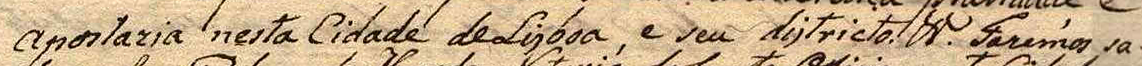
apostazia nesta Cidade de Lisboa, e seu districto. &r. Fazemos sa
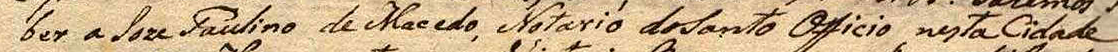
ber a Ioze Paulino de Macedo, Notario do Santo Officio nesta Cidade,
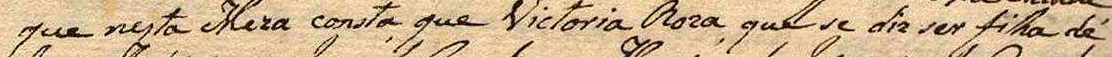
que nesta Meza consta, que Victoria Roza, que se diz ser filha de
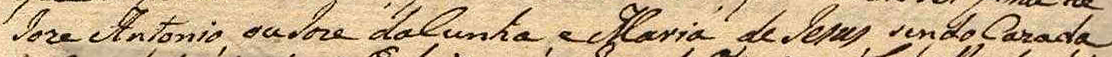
Ioze Antonio ou Ioze da Cunha, e Maria de Iesus sendo Cazada,
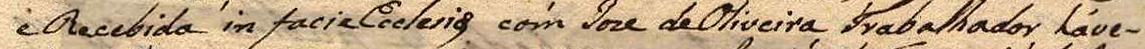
e Recebida in facia Ecclesiæ com Ioze de Oliveira, trabalhador, have
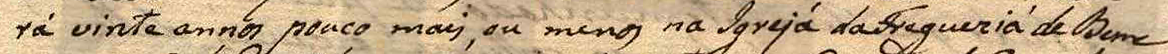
rá vinte annos pouco mais, ou menos na Igreja da Freguezia de Bem
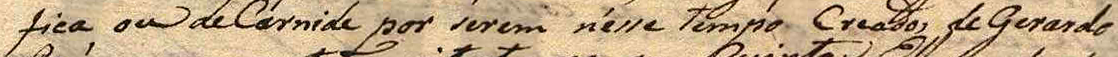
fica, ou de Carnide por serem nésse tempo Creados de Gerardo
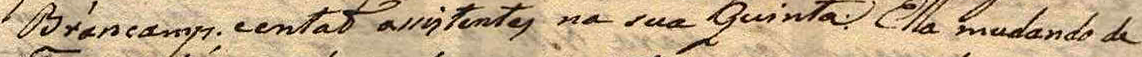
Brancamp; e entaõ assistentes na sua Quinta: Ella mudando de
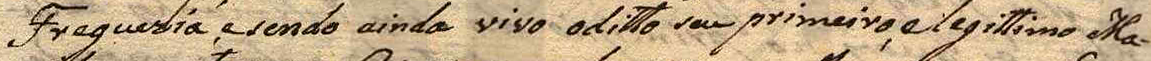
Freguezia, e sendo ainda vivo o ditto seu primeiro, e legittimo Ma
